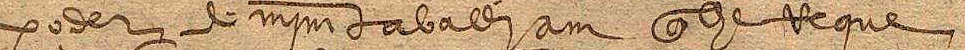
poder de mjm taballjam q̄ lhe Reque
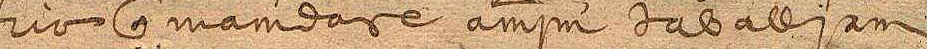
ria q̄ mamdase a mjm taballiam
